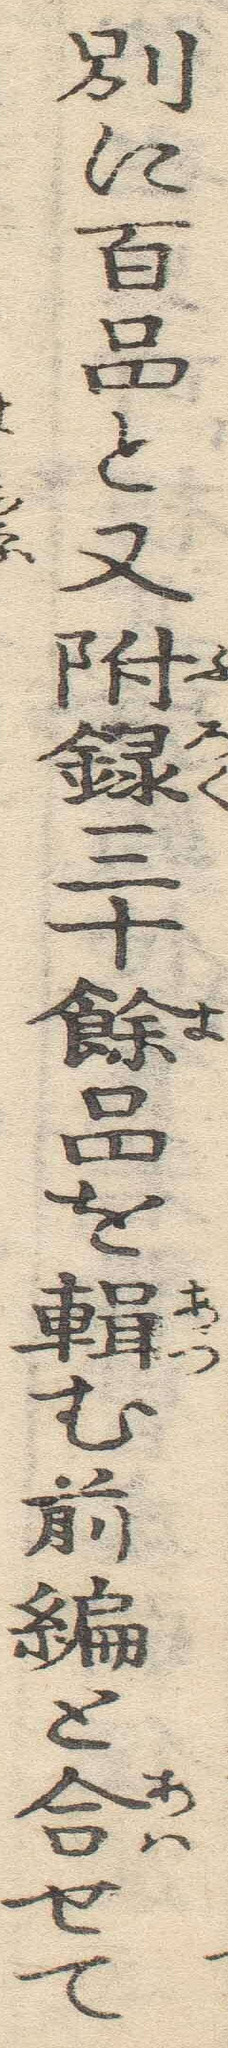別に百品と又附録三十余品を輯む前編と合せて
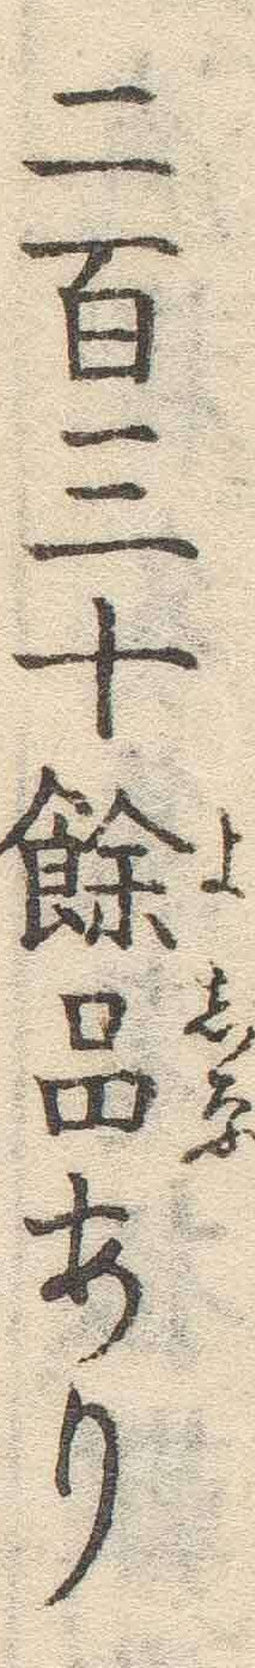二百三十余品あり
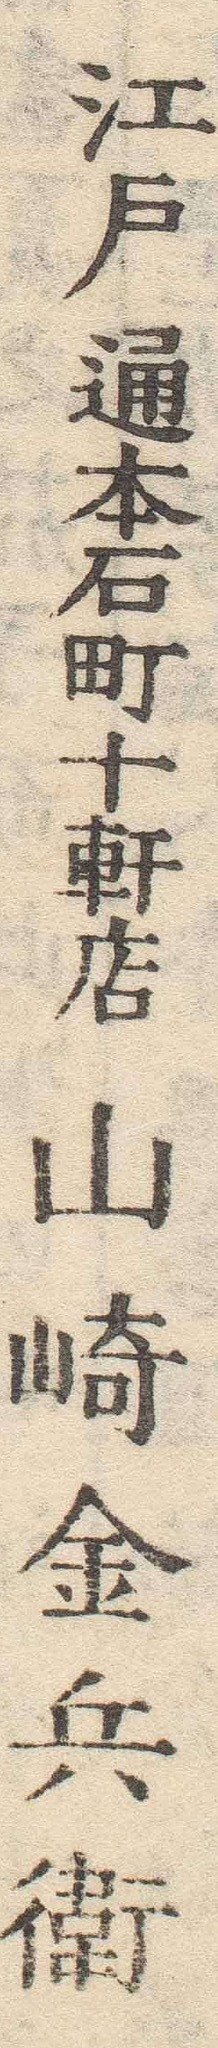江戸通本石町十軒店山崎金兵衛
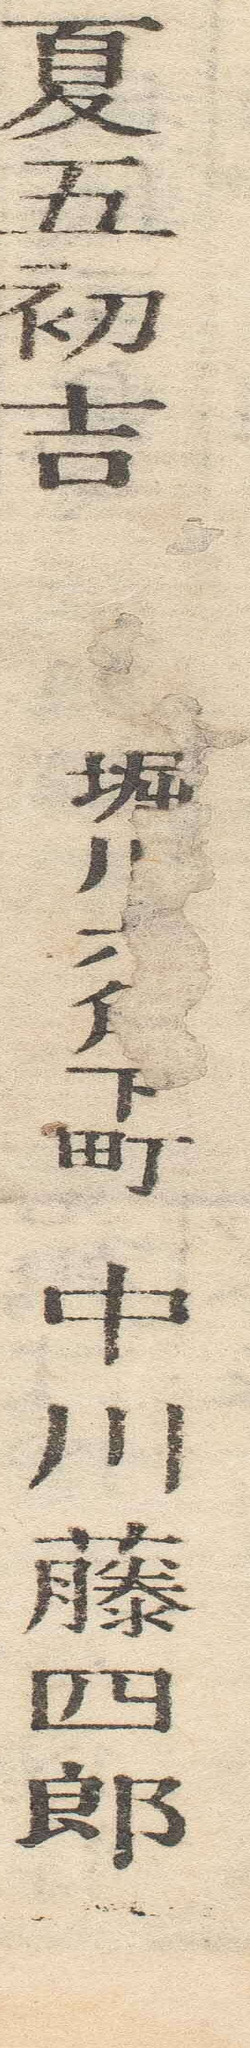夏五初吉堀川六角下町中川藤四郎
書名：豆腐百珍
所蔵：東京学芸大学附属図書館 国文学研究資料館
